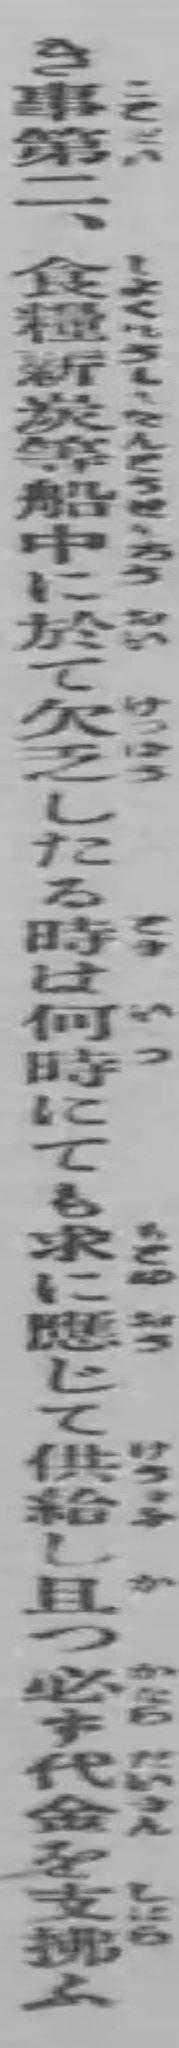き事第二、食糧薪炭等船中に於て欠乏したる時は何時にても求に応じて供給し且つ必ず代金を支払ふ
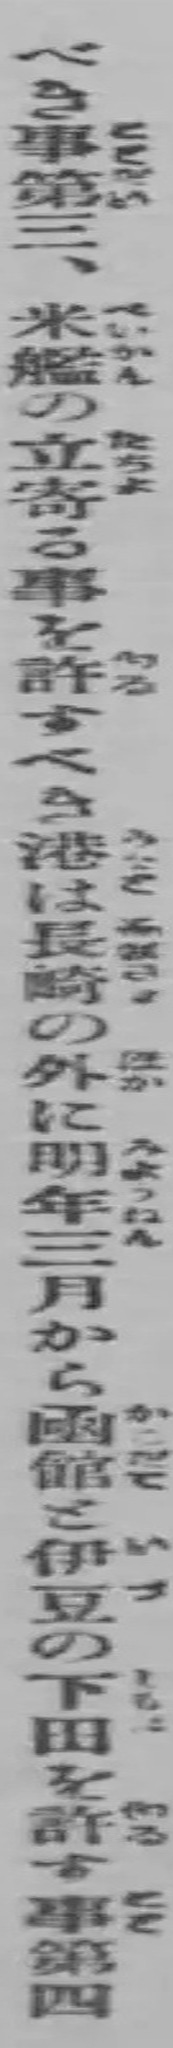べき事第三、米艦の立寄る事を許すべき港は長崎の外に明年三月から函館と伊豆の下田を許す事第四
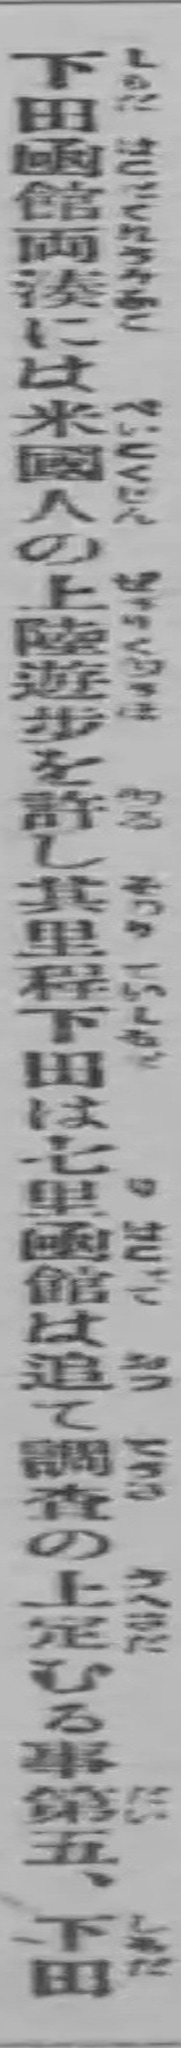下田函館両湊には米国人の上陸遊歩を許し其里程下田は七里函館は追て調査の上定むる事第五、下田
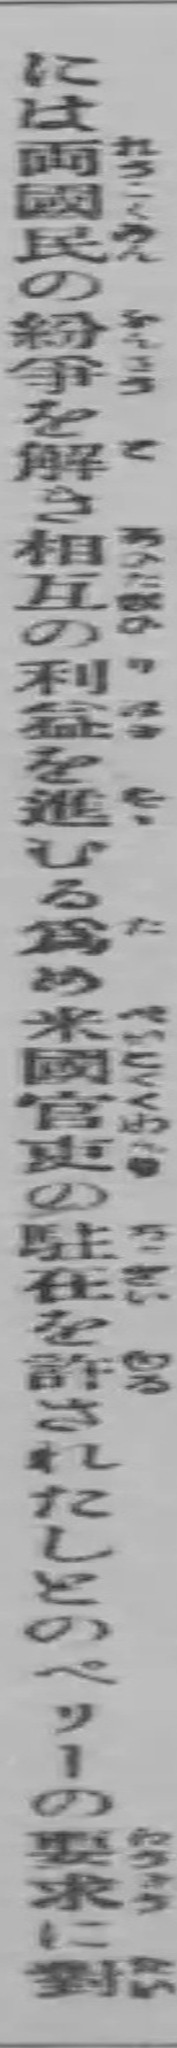には両国民の紛争を解き相互の利益を進むる為め米国官吏の駐在を許されたしとのペリーの要求に対
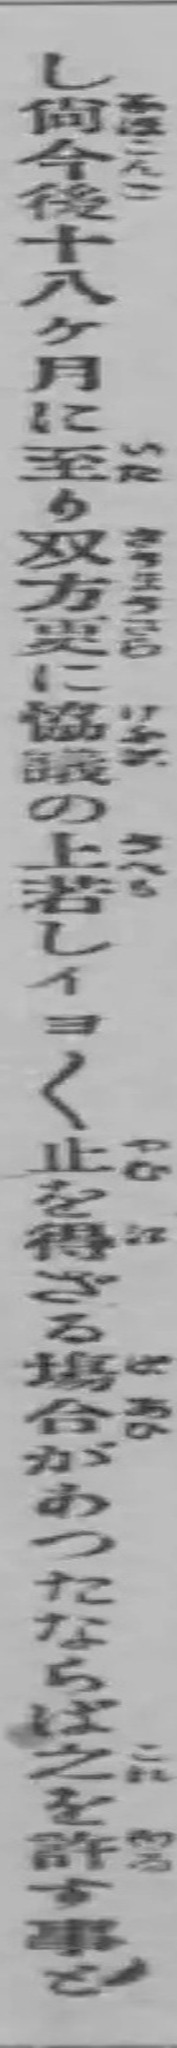し尚今後十八ケ月に至り双方更に協議の上若しイヨ〳〵止を得ざる場合があつたならば之を許す事と
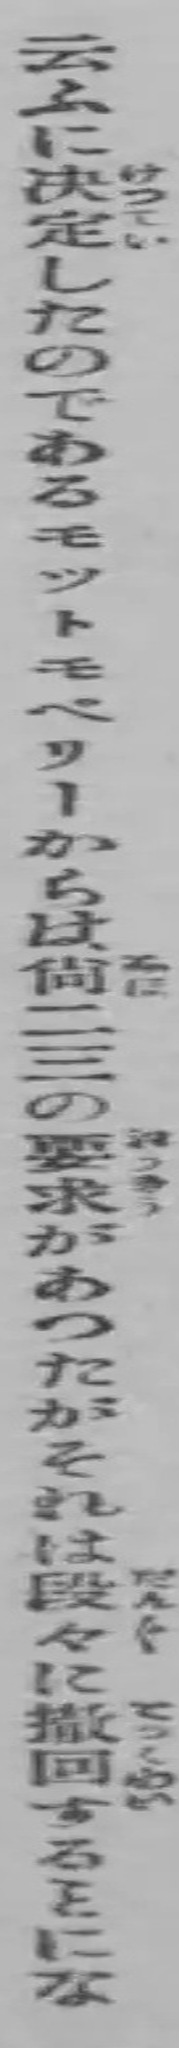云ふに決定したのであるモツトモペリーからは尚二三の要求があつたがそれは段々に撤回することにな
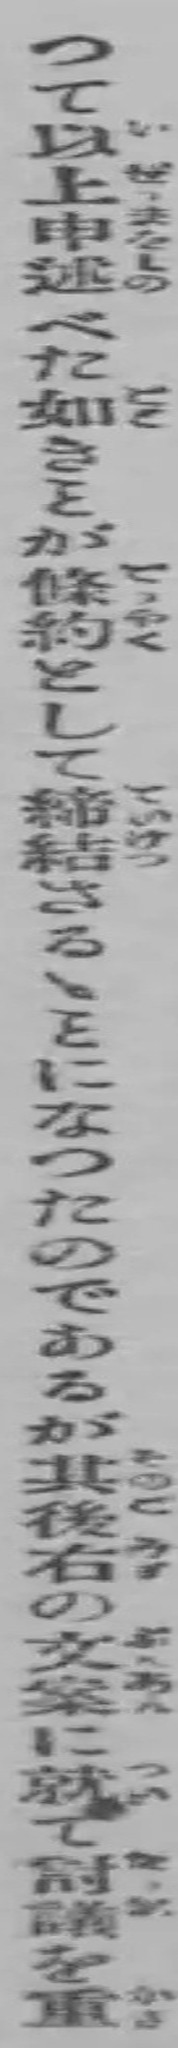つて以上申述べた如きことが条約として締結さるゝことになつたのであるが其後右の文案に就て討議を重
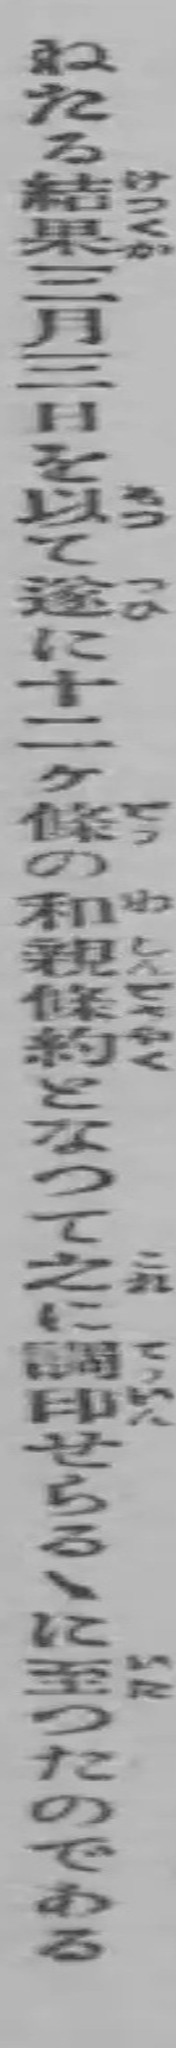ねたる結果三月三日を以て遂に十二ケ条の和親条約となつて之に調印せらるゝに至つたのである
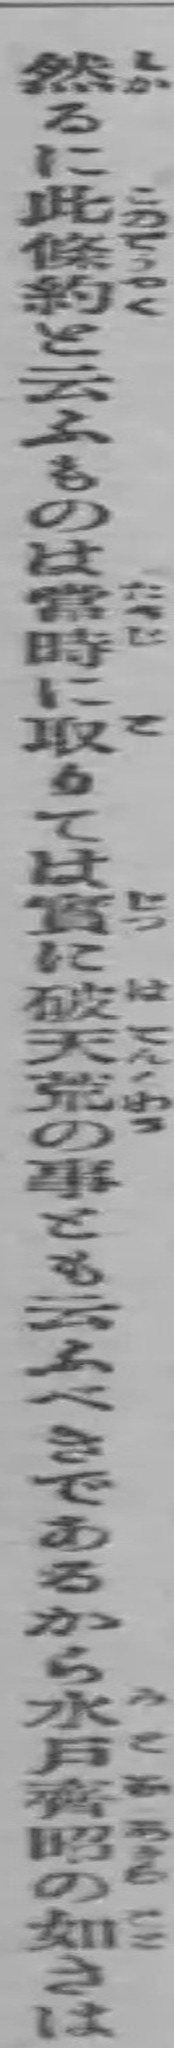然るに此条約と云ふものは当時に取りては実に破天荒の事とも云ふべきであるから水戸斉昭の如きは

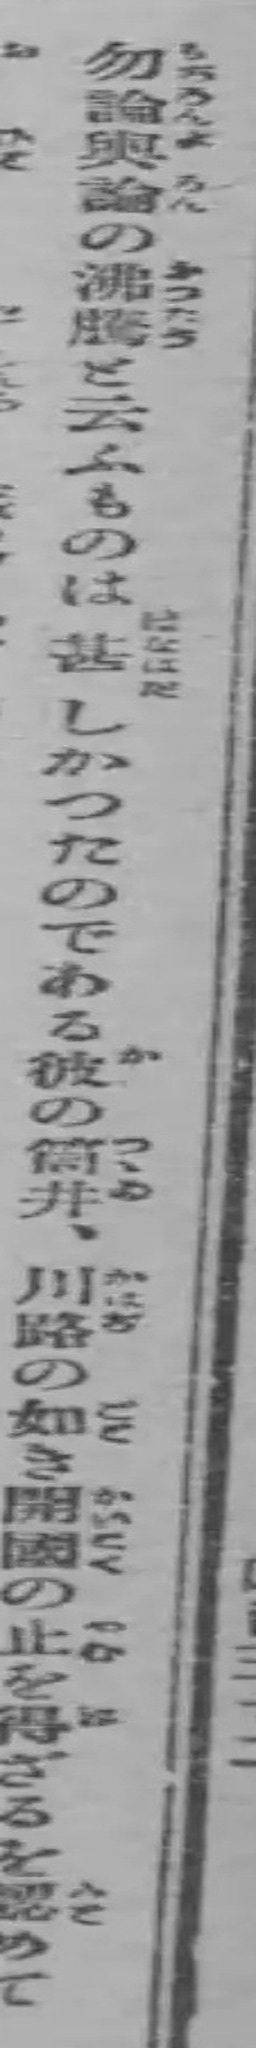勿論輿論の沸騰と云ふものは甚しかつたのである彼の筒井、川路の如き開国の止を得ざるを認めて
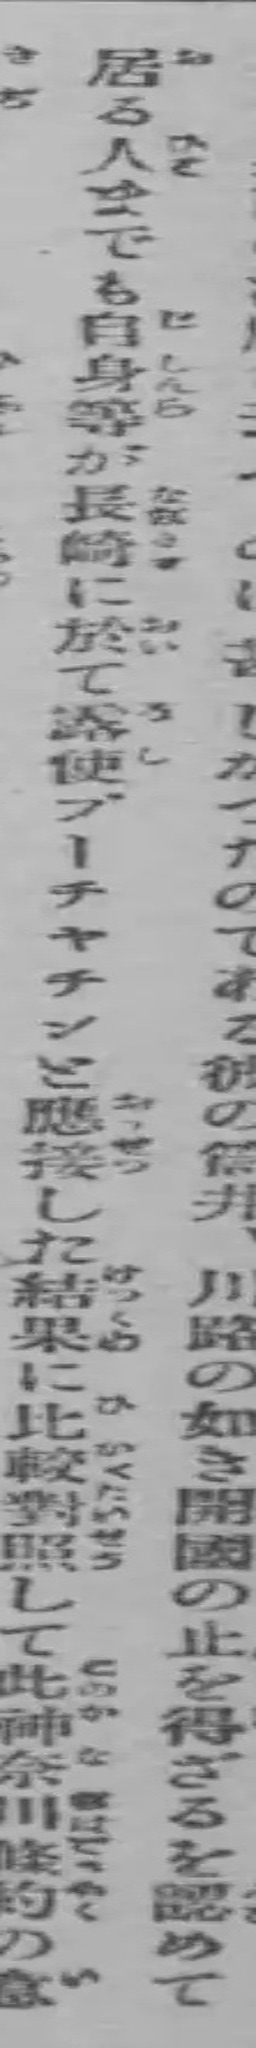居る人までも自身等が長崎に於て露使プーチヤチンと応接した結果に比較対照して此神奈川条約の意
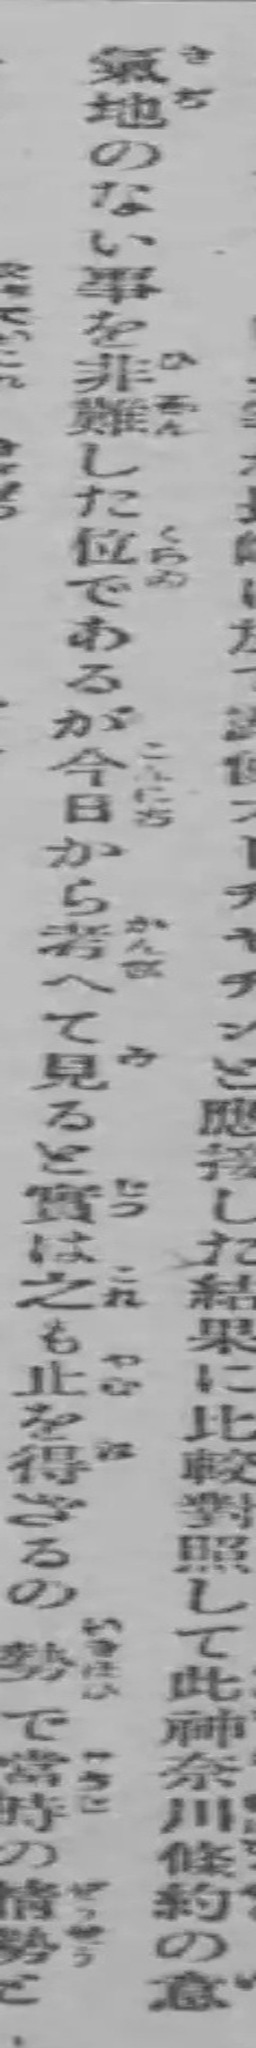気地のない事を非難した位であるが今日から考へて見ると実は之も止を得ざるの勢で当時の情勢と
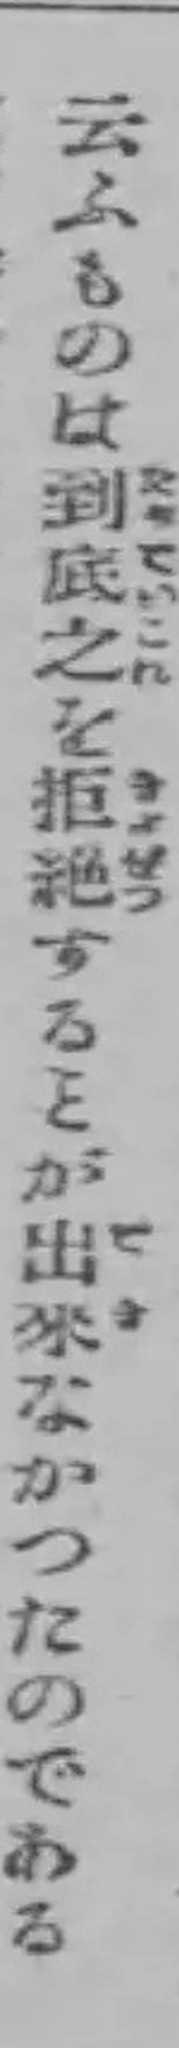云ふものは到底之を拒絶することが出来なかつたのである
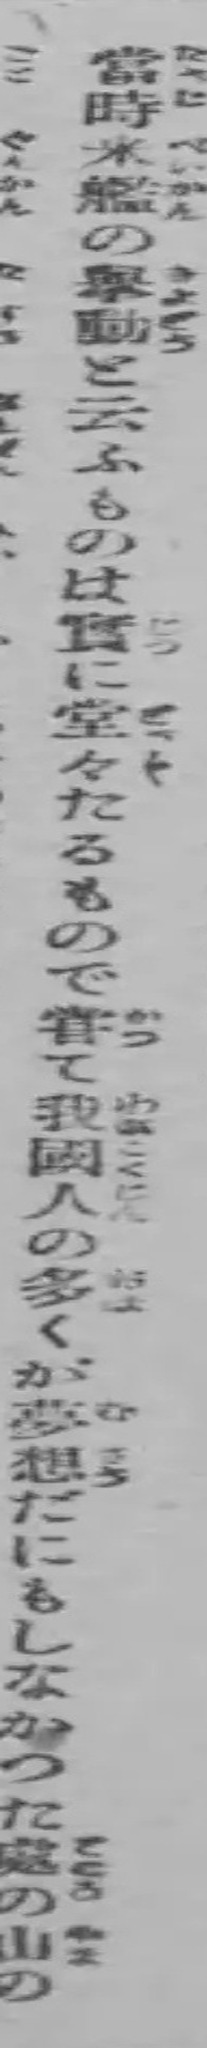当時米艦の挙動と云ふものは実に堂々たるもので嘗て我国人の多くが夢想だにもしなかつた処の山の
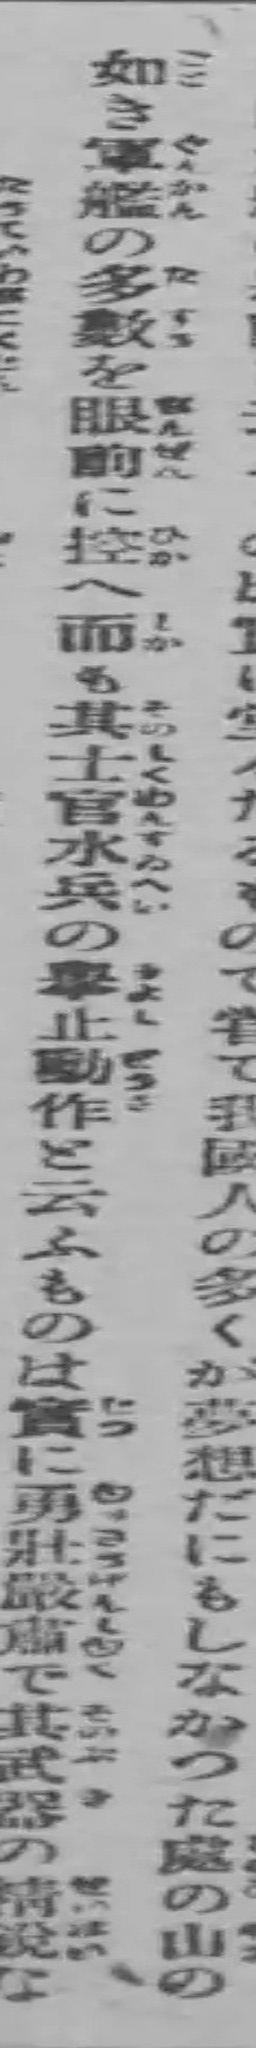如き軍艦の多数を眼前に控へ而もその士官水兵の挙止動作と云ふものは実に勇壮厳粛で其武器の精鋭な
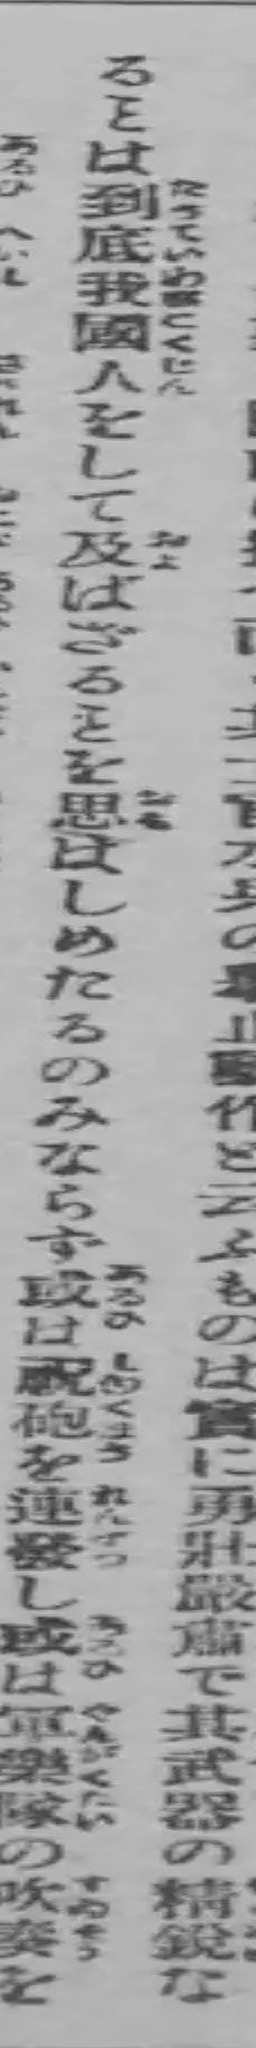ることは到底我国人をして及ばざることを思はしめたるのみならず或は祝砲を連発し或は軍楽隊の吹奏を
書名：豊橋市史談
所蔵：国立国会図書館 National Diet Library, JAPAN
